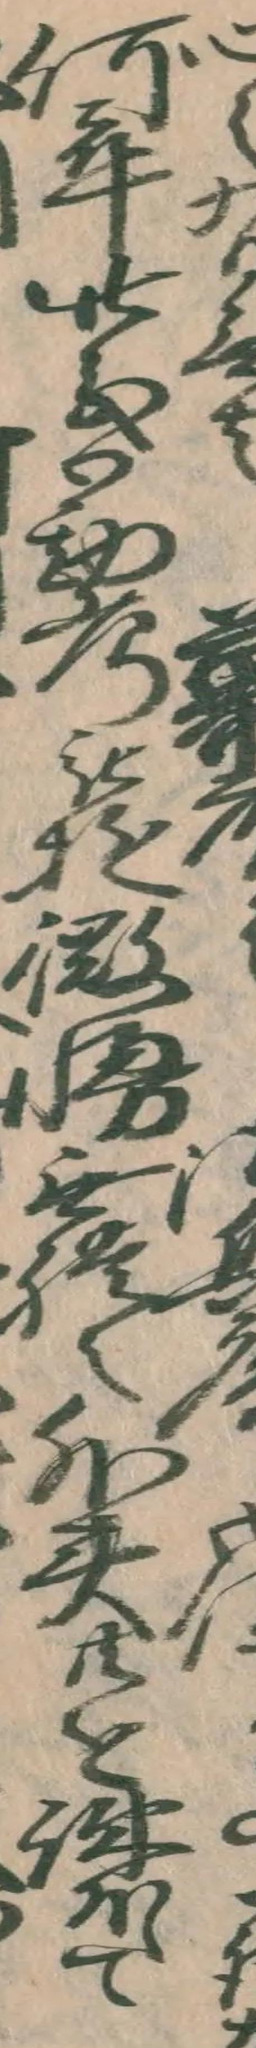何卒此義御勘考被遊傲慢無禮之外夷を疎外候て
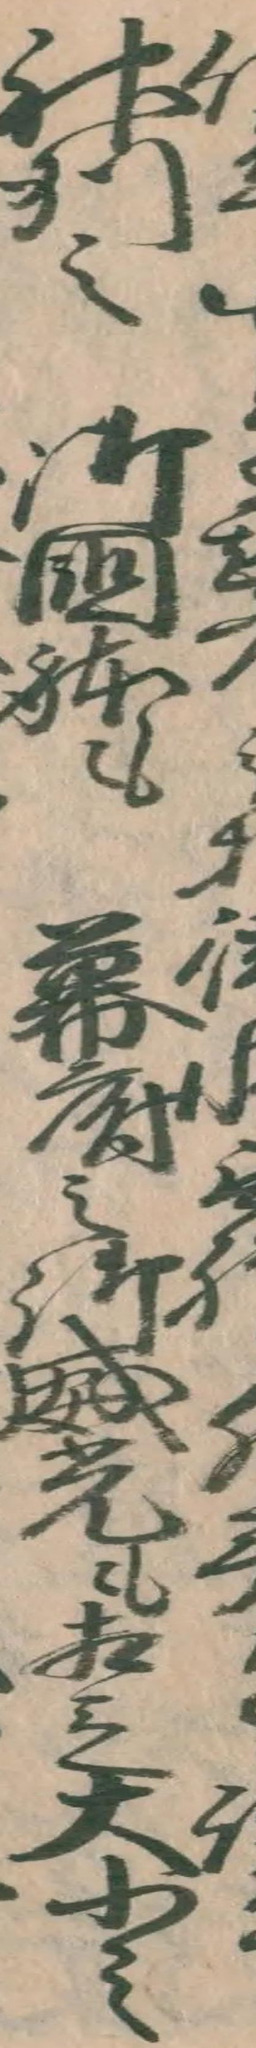神州之御国躰も幕府之御威光も相立大小之
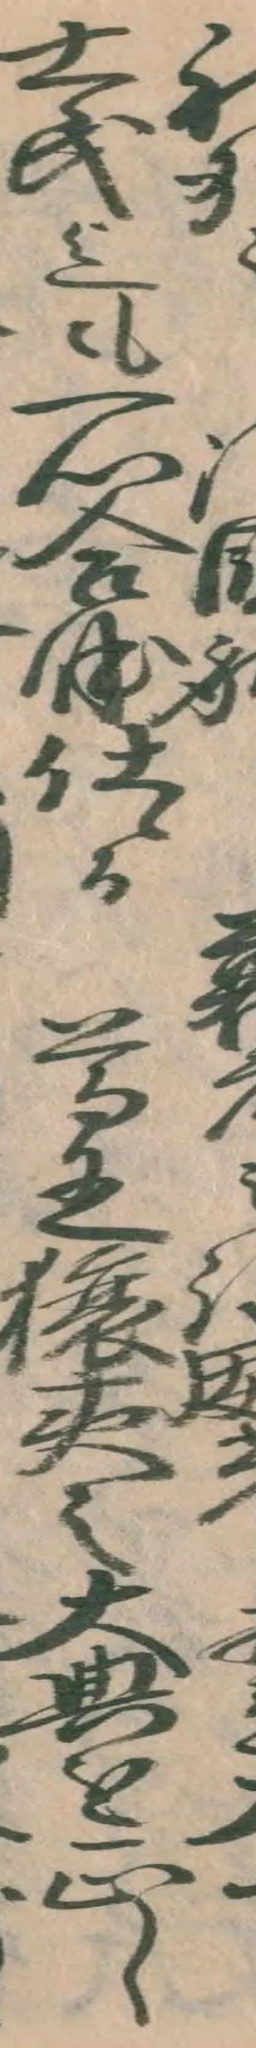士民迄も一心合体仕候而尊王攘夷之大典を正し
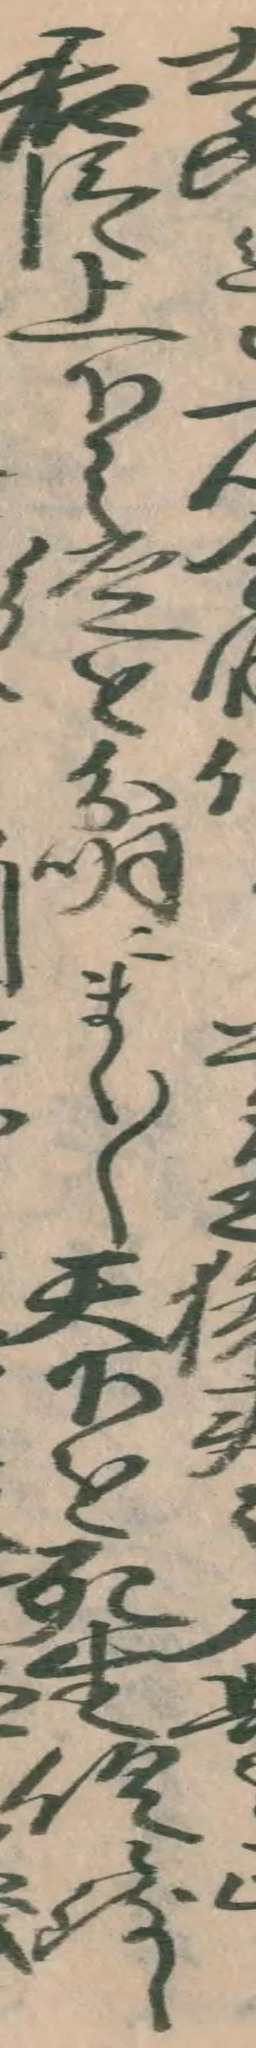君臣上下之徑を分明ニまし〳〵天下を死生俱ニ致し
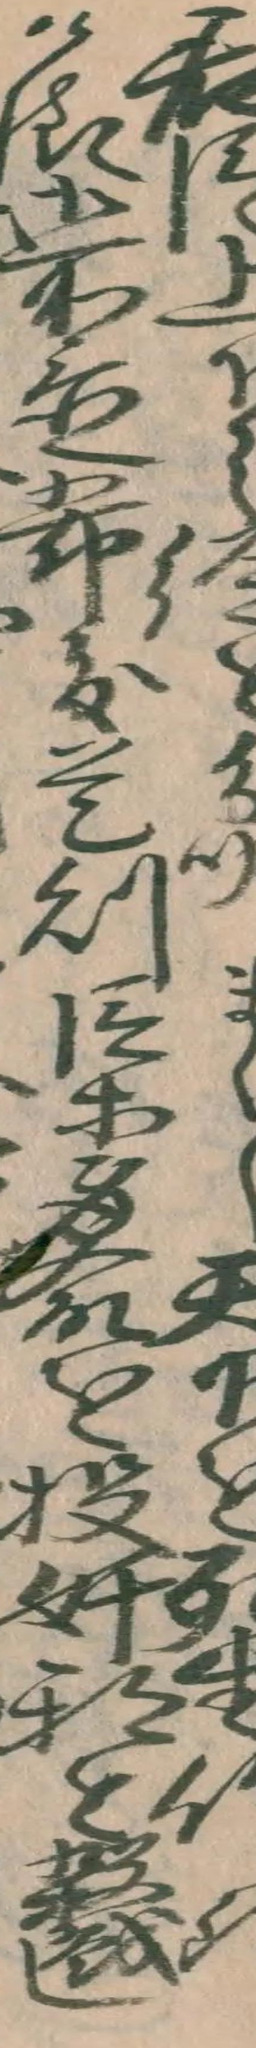候様御所置希度是則臣等身命を投奸邪を殺戮し
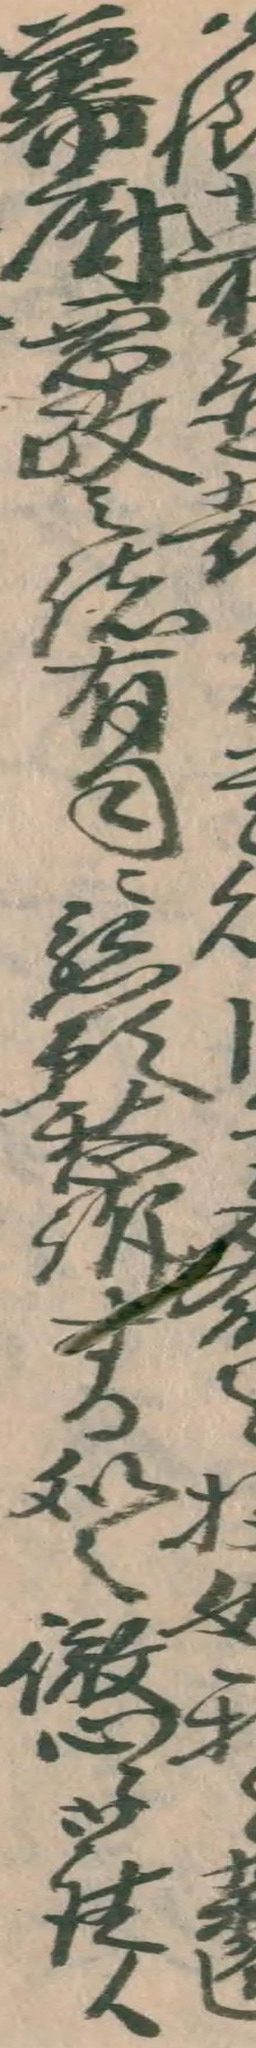幕府悪政之諸有司ニ懇願愁訴する処之微心ニ御座候
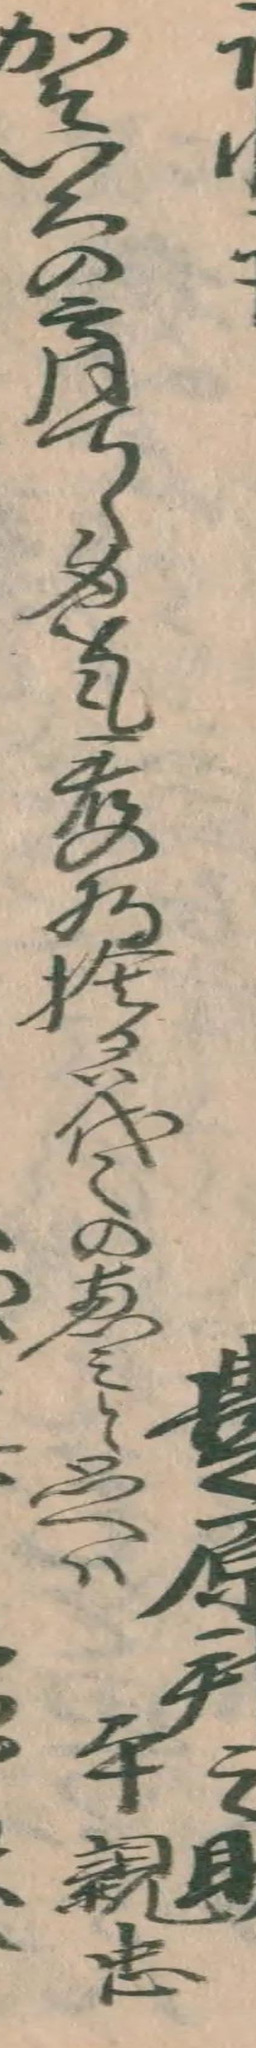かそいろの育てし身をも君の為捨るハ代々の恵ミと思へハ平親忠
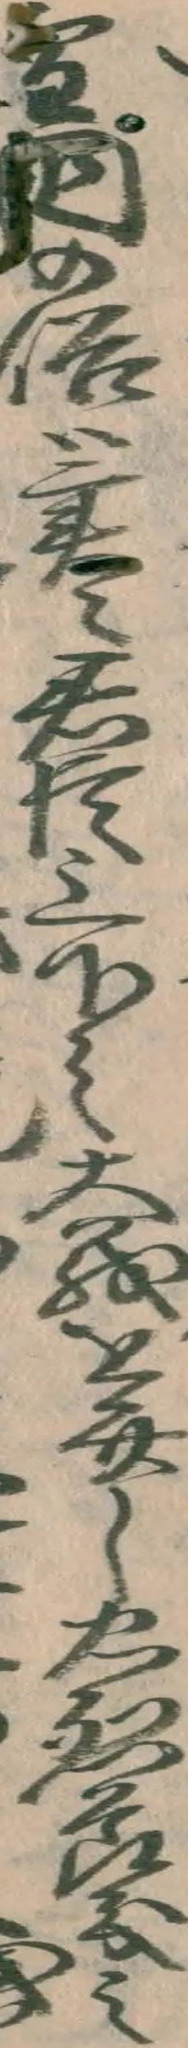皇国の俗ハ実ニ君臣上下之大義を弁し忠烈節義之
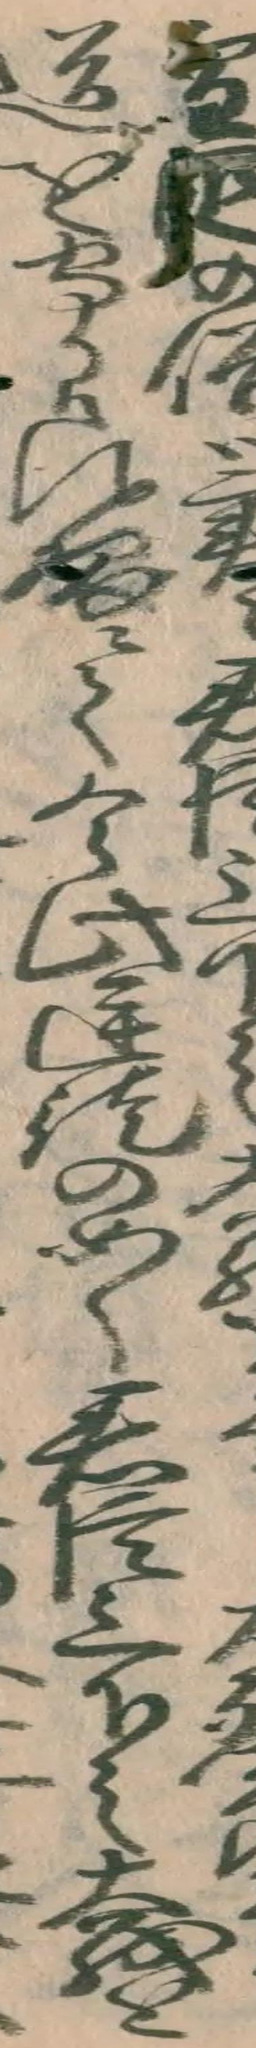道を守り候風習ニて今此逆徒の如く君臣上下之大義を
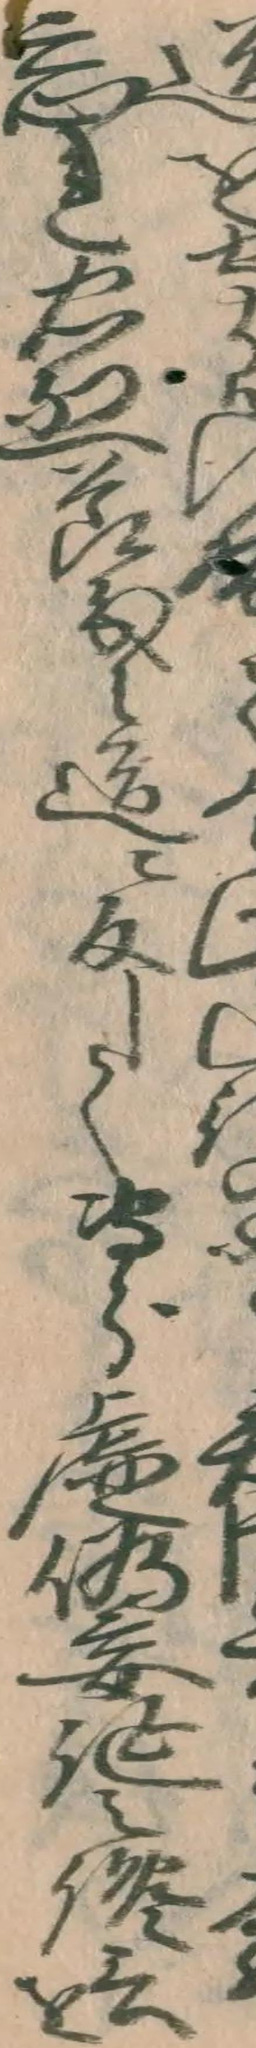忘れ忠烈節義之道ニ反して専ら虚偽妄誕之讒言を
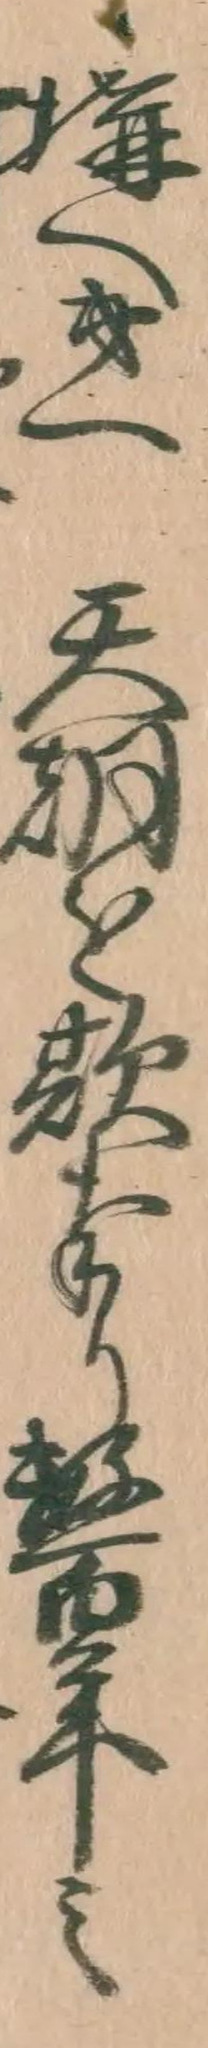構へ第一天朝を欺奉り数百年之
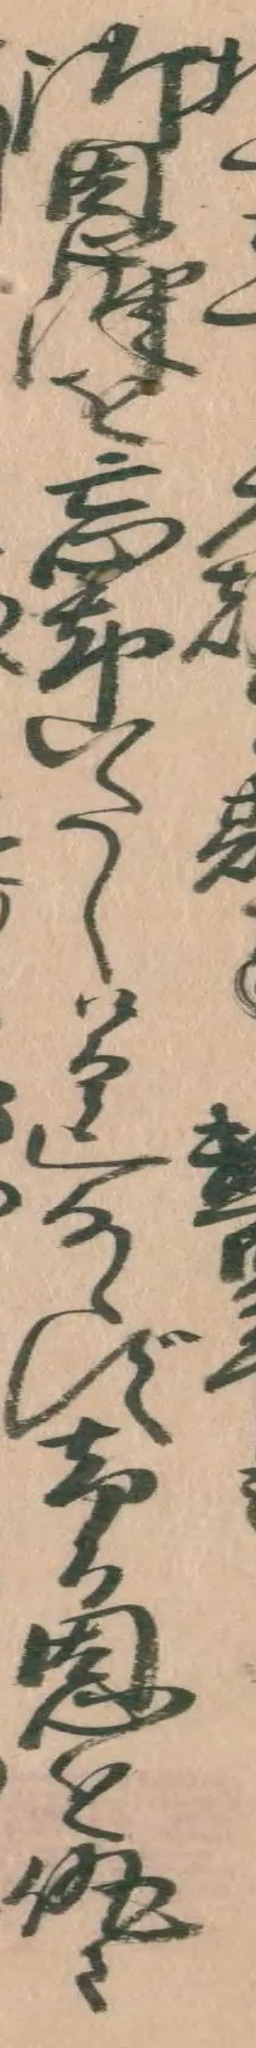御恩澤を忘却いたし候而已ならず却て恩を仇に
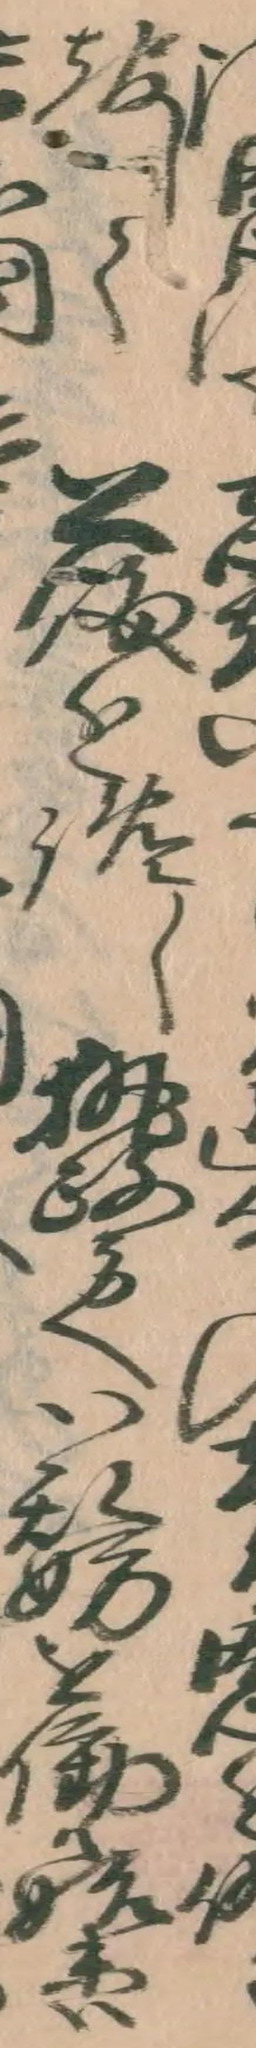報して公儀を讒し執政方へハ乱妨を働候始末ハ
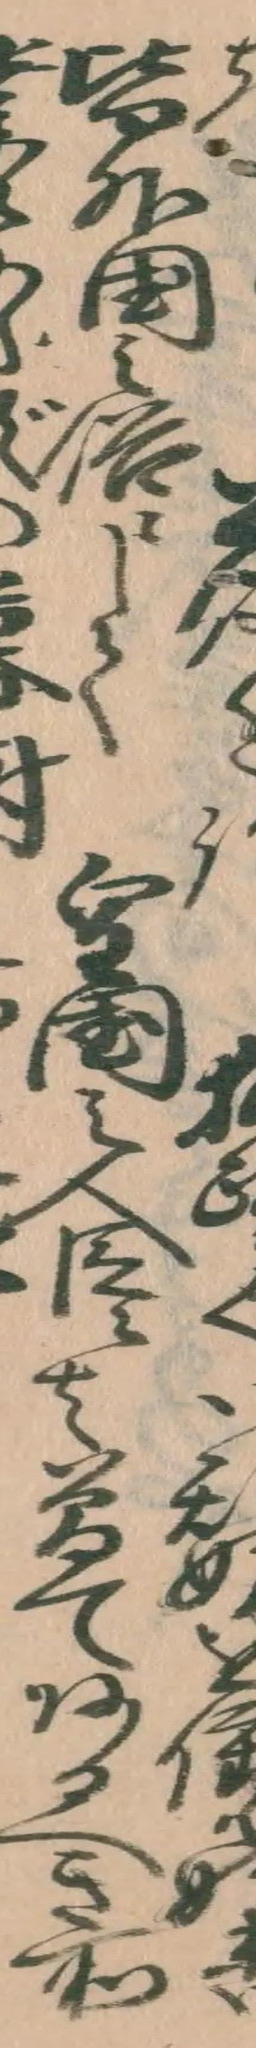皆外国之俗ニして皇国之人臣ニ者曽てあるへき所
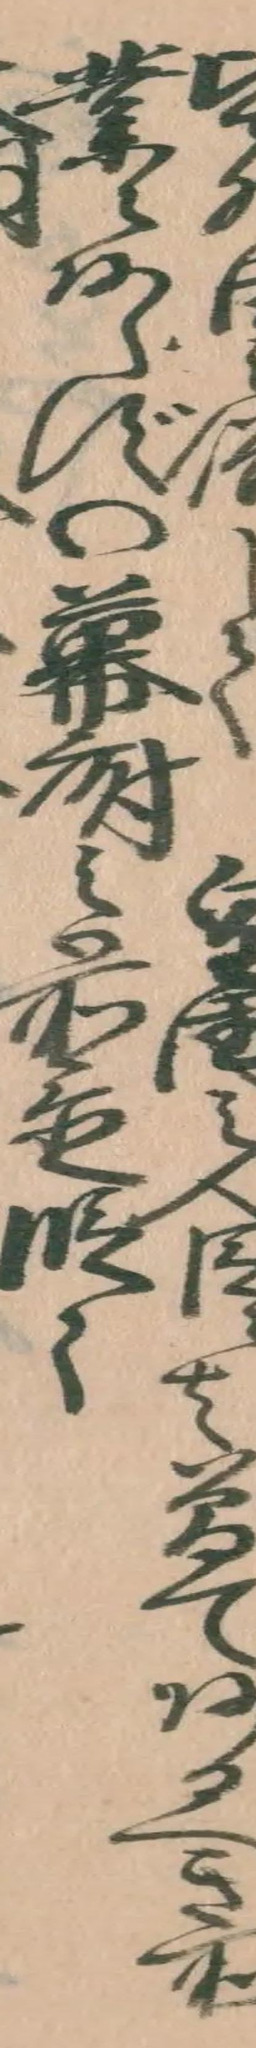業ニあらず〇幕府之御所置段々
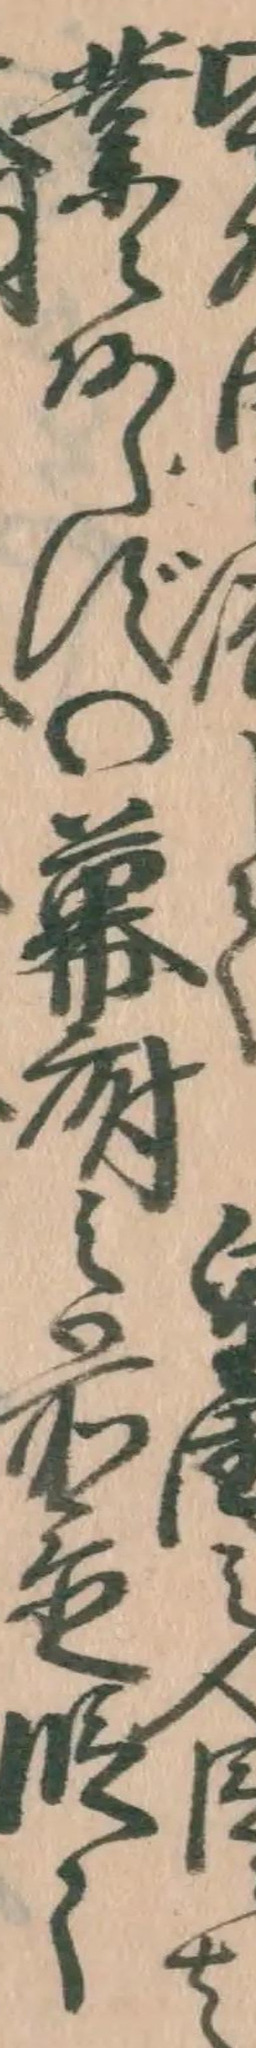業ニあらず〇幕府之御所置段々
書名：麗斎叢書. 20
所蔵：国立国会図書館 National Diet Library, JAPAN
